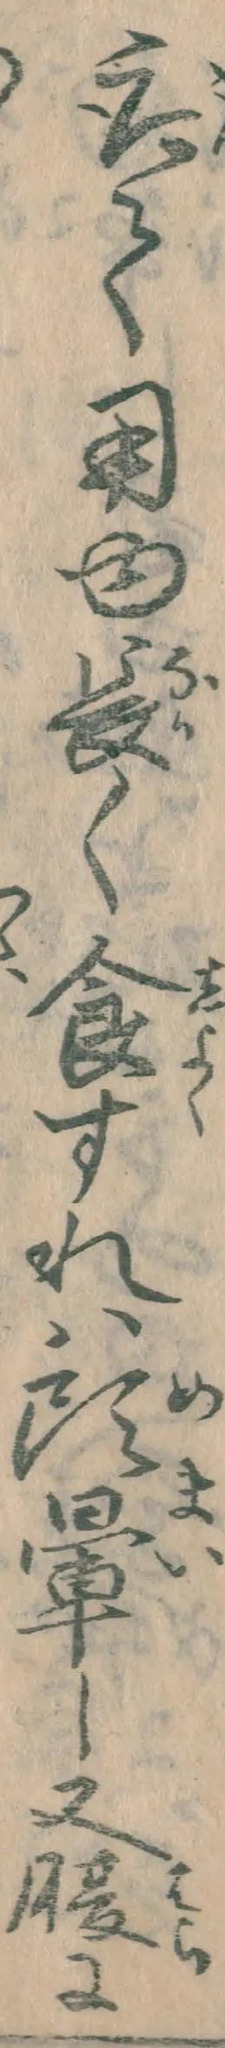取て用ゆ長く食すれは頭暈し又腹に
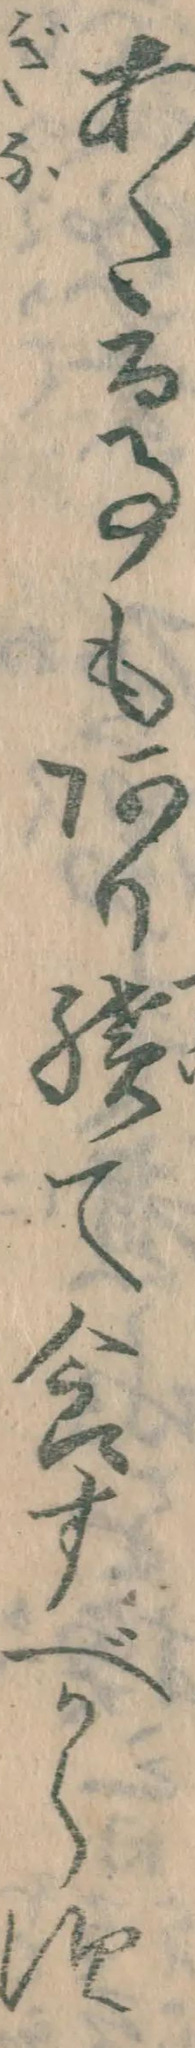あたる事もあり続て食すべからず
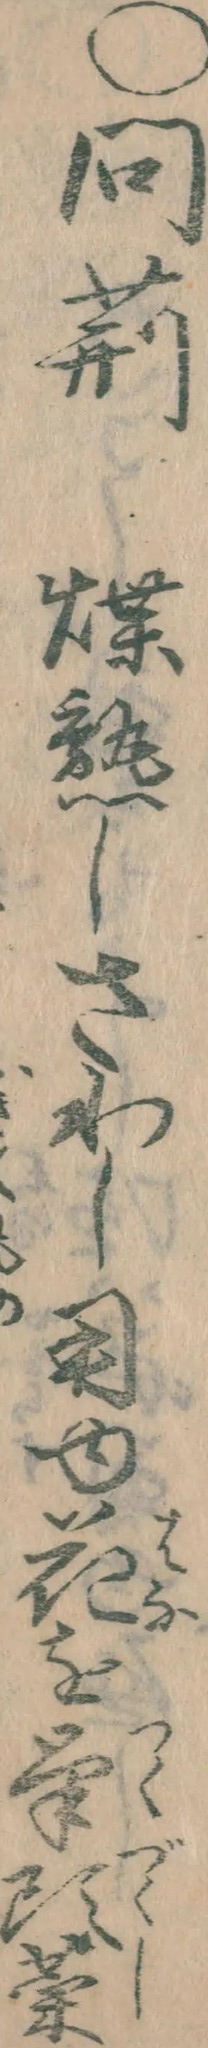〇問荊爛熟しさわし用ゆ花を筆頭菜
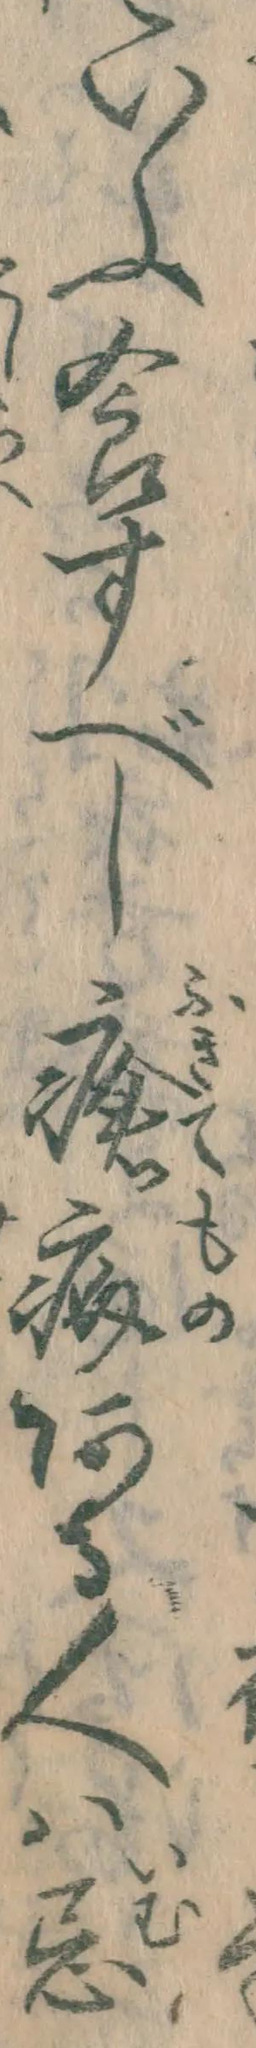といふ食すべし瘡病ある人は忌
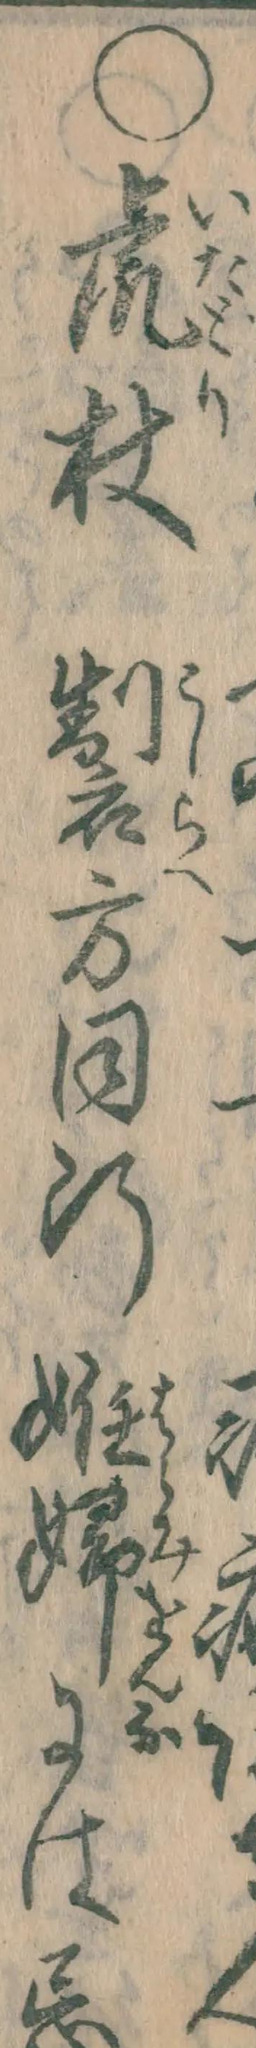〇虎杖製方同断妊婦には忌
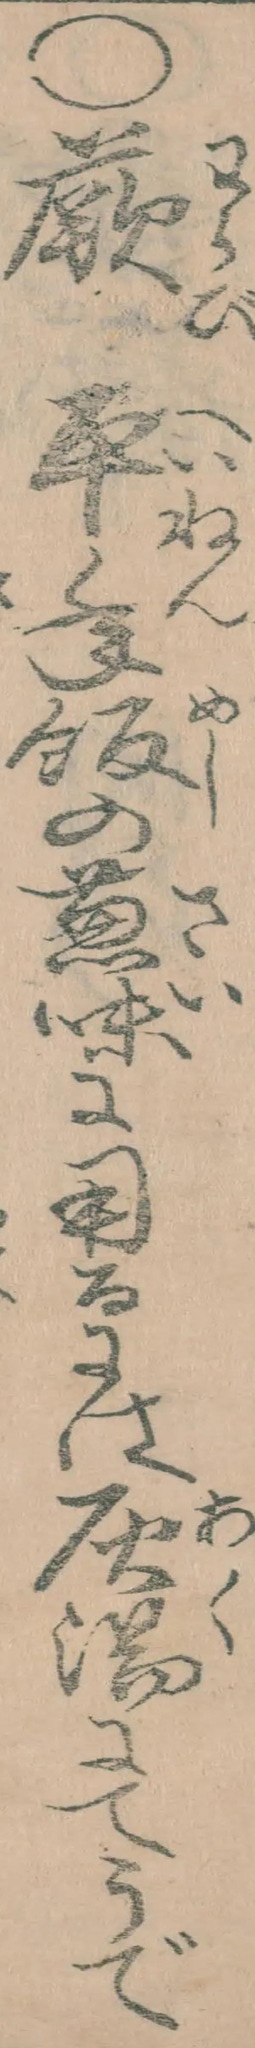〇蕨平年飯の葱味に用るには灰湯にてうで
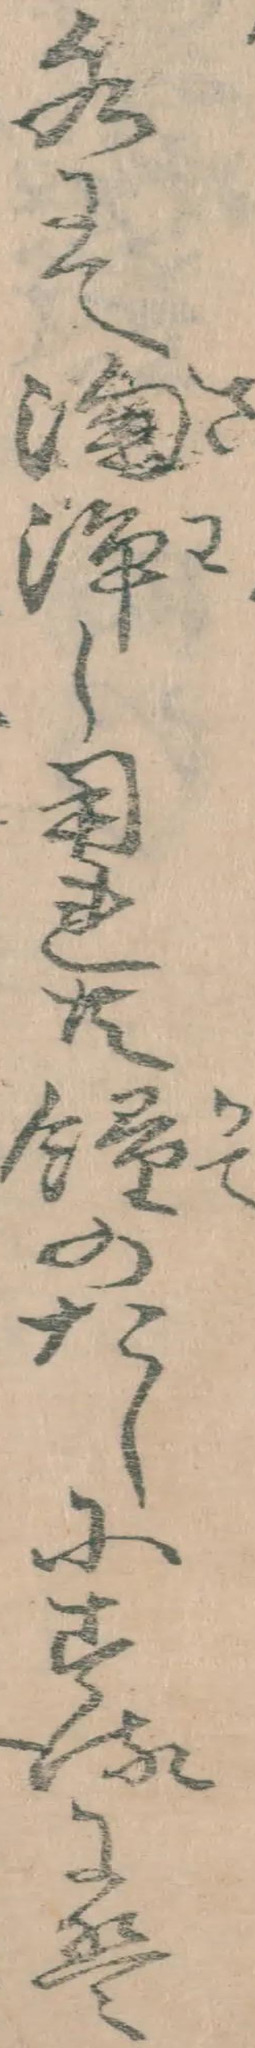水にて淘浄し用れ共饉のたしにするには
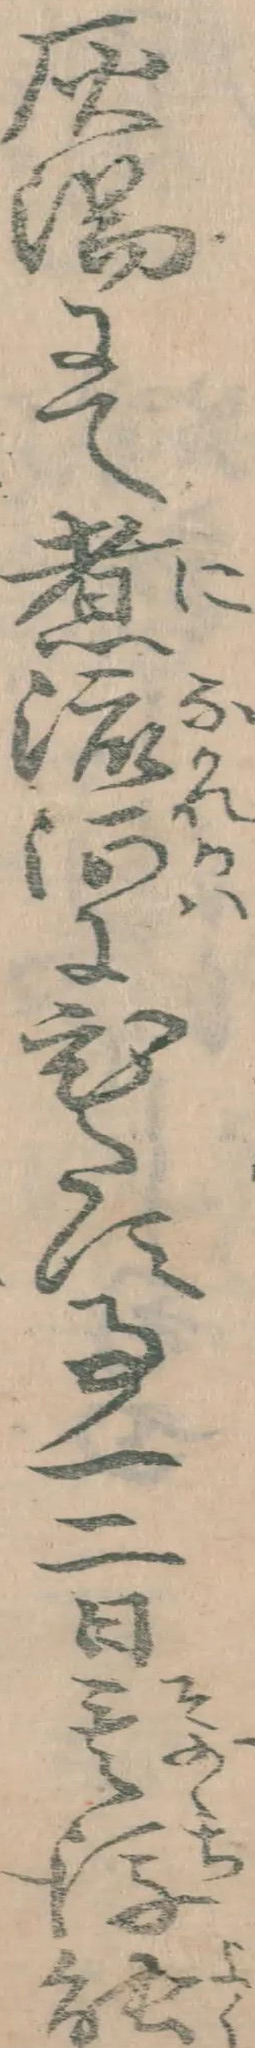灰湯にて煮流河にひたす事一二日その後能
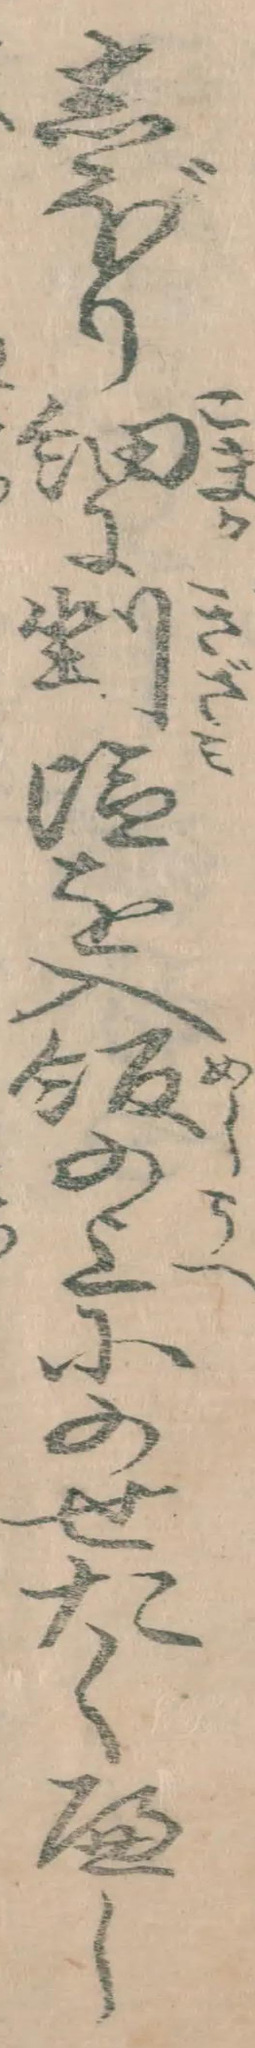しぼり細に刻塩を入飯の上にのせたくべし
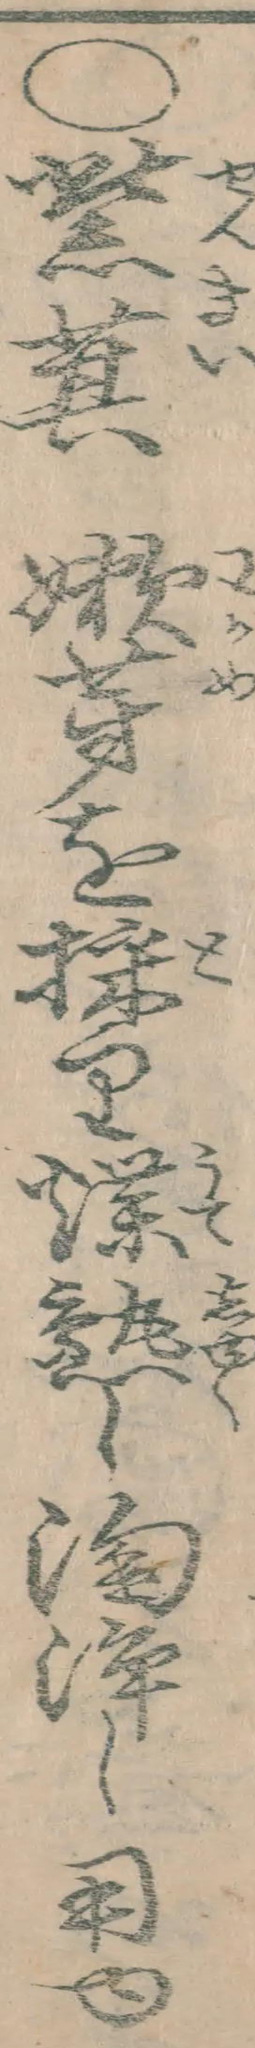〇紫茸嫩芽を採り爛熟し淘浄し用ゆ
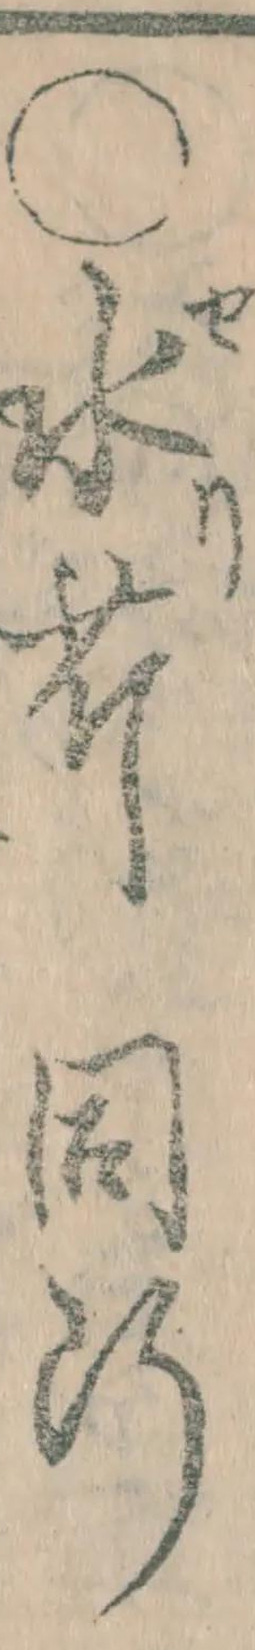〇水芹同断
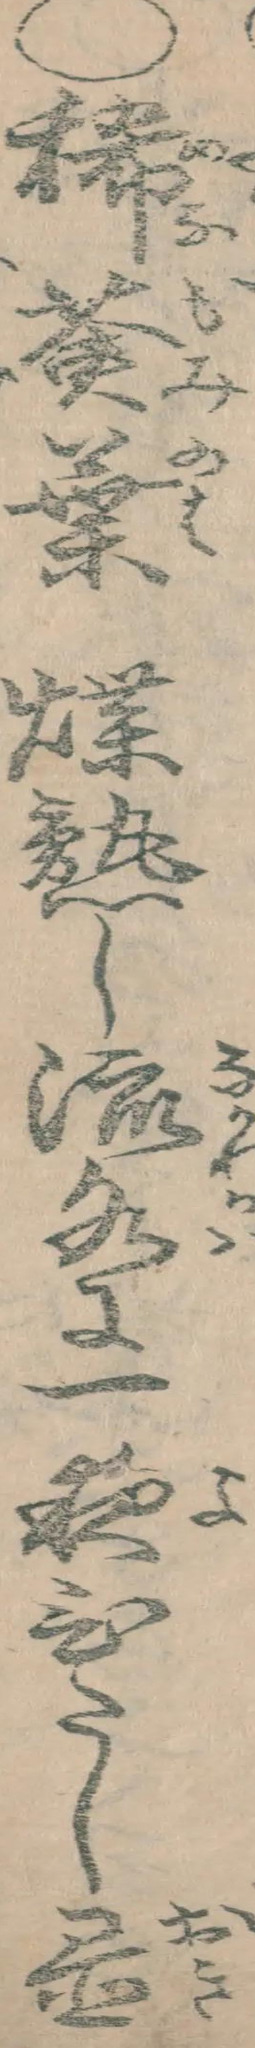〇稀薟葉爛熟し流水に一夜ひたし置
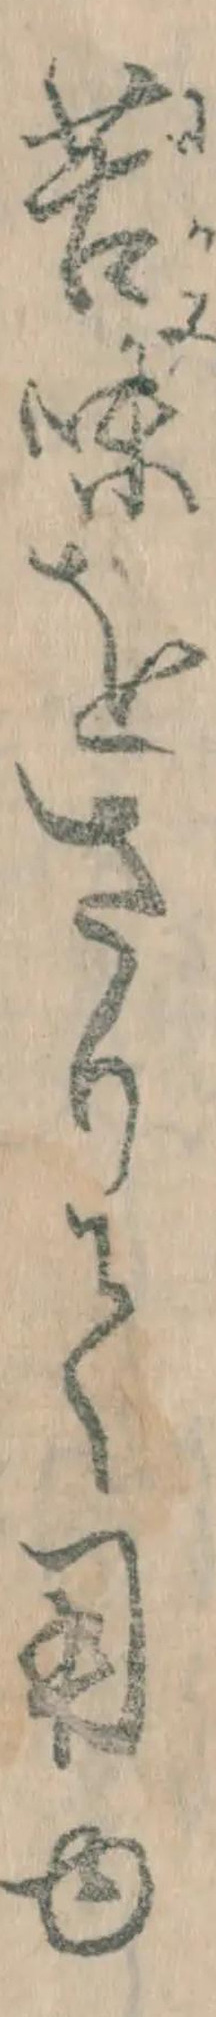苦味をさりて用ゆ

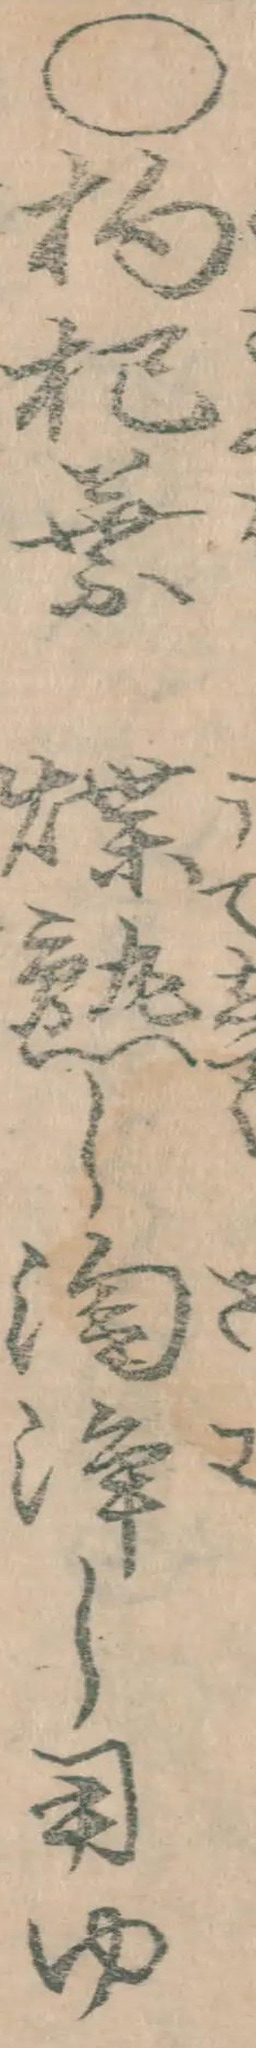〇佝杞葉爛熟し淘浄し用ゆ
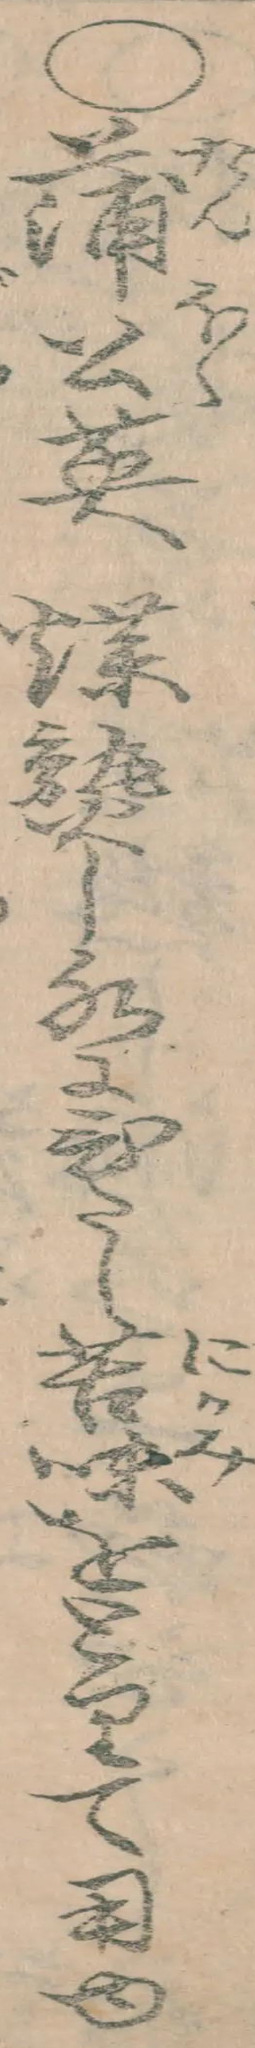〇蒲公英爛熟し水にひたし苦味をとりて用ゆ
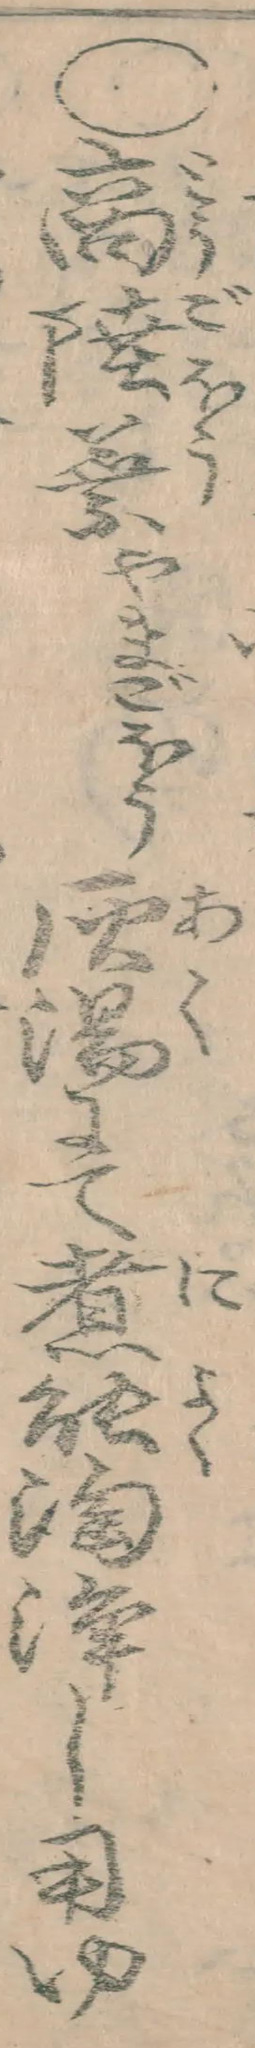〇商陸葉やまごほう灰湯にて煮よ能淘浄し用ゆ
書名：救荒鄙諭
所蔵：国立国会図書館 National Diet Library, JAPAN
